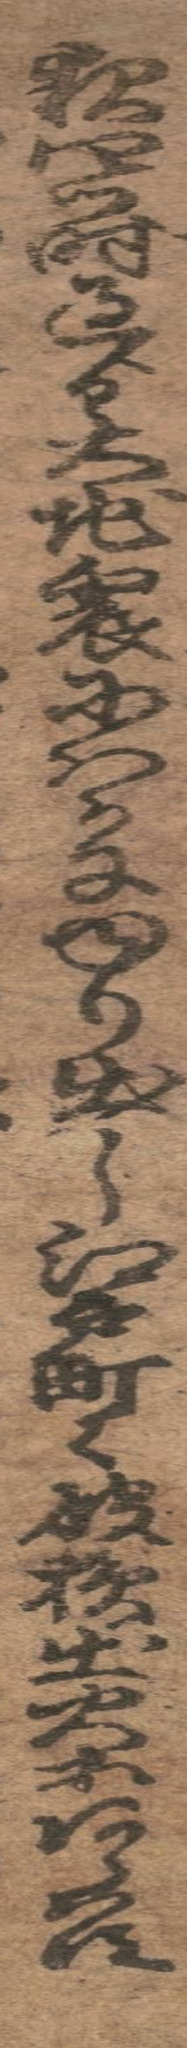夜四ツ時過ゟ大地震にはかにゆり出し江戸町々破損出火等あらす
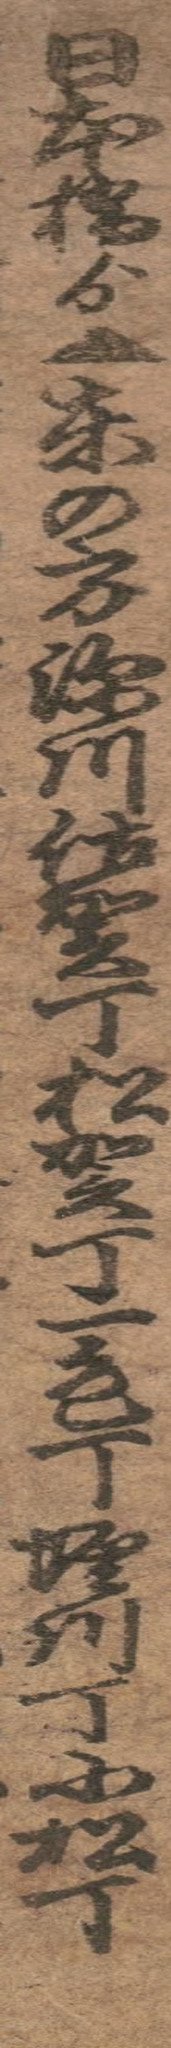日本橋ゟ▲東の方深川佐賀丁松賀丁一色丁堀川丁小松丁
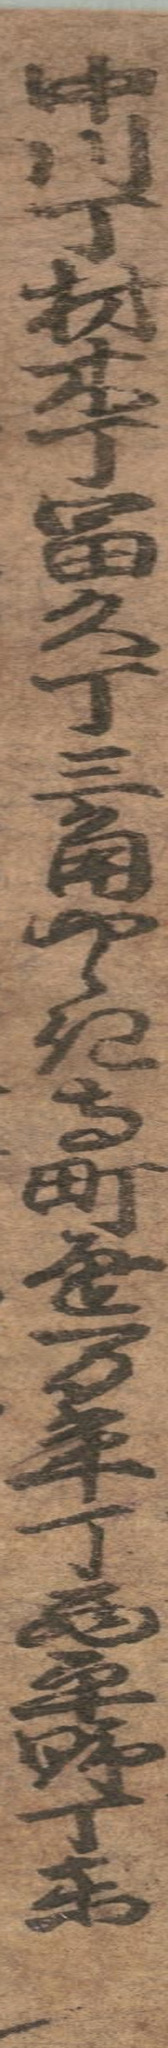中川丁材木丁冨久丁三角やしき寺町通万年丁西平野丁東
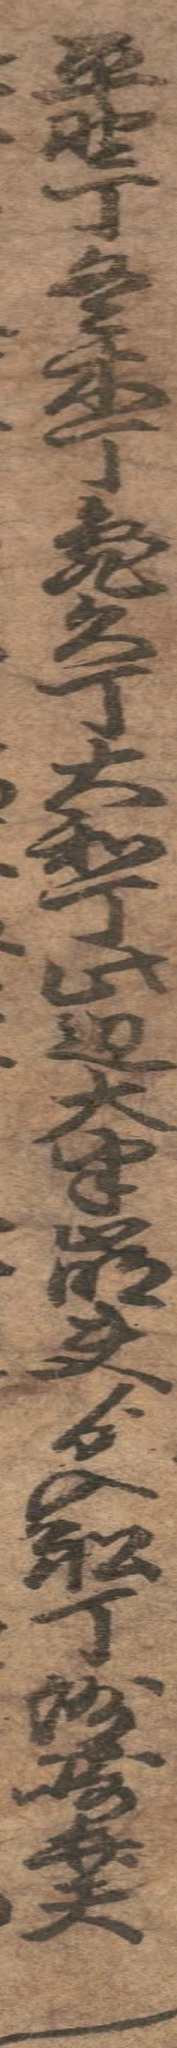平野丁冬木丁亀久丁大和丁此辺大半崩夫ゟ入舩丁洲崎弁天
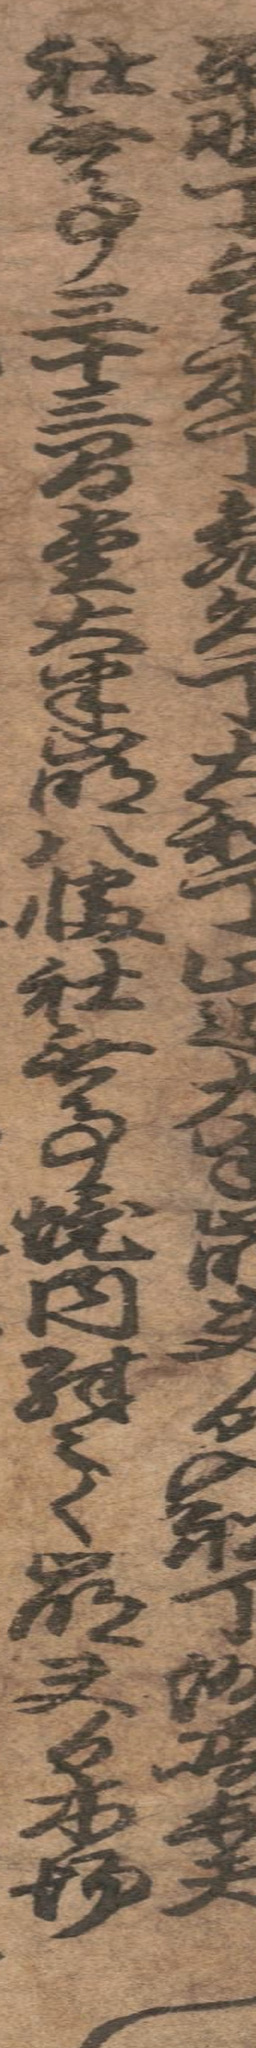社無事三十三間堂大半崩八幡社無事境内殊々く崩夫ゟ木場
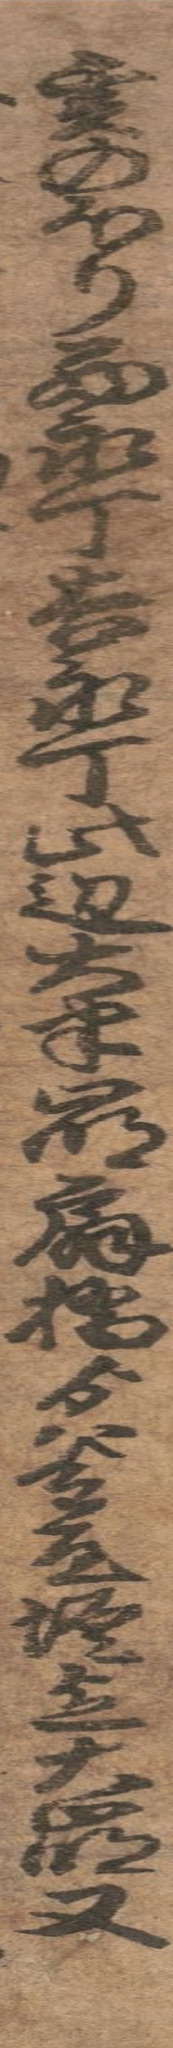亥のほり西永丁吉永丁此辺大半崩扇橋ゟ谷屋堀迄大崩又
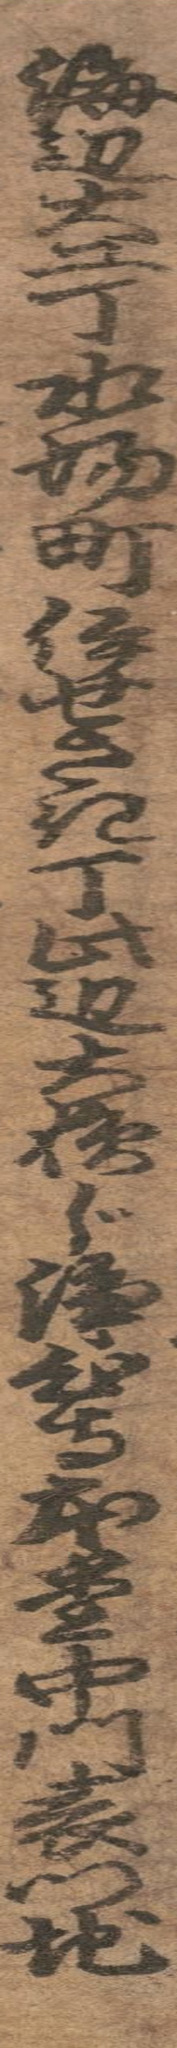海辺大工丁水場丁伊せさき丁此辺大損じ浄心寺本堂中門表門地
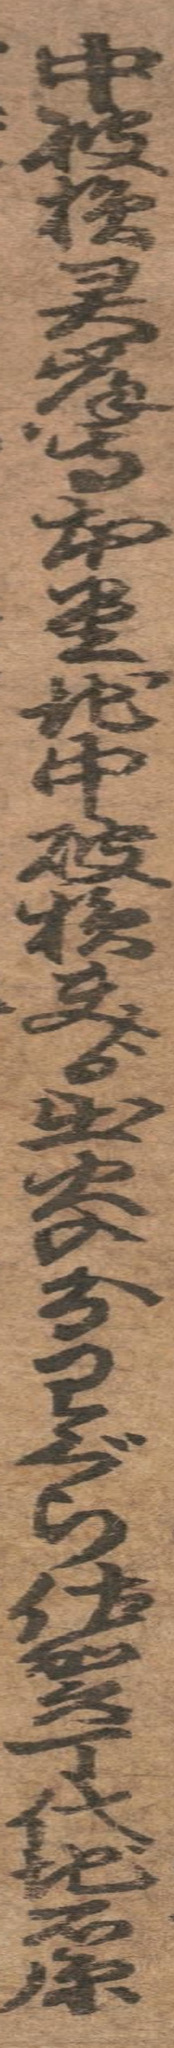中破損霊岸寺本堂地中破損夫ゟ出火の分わぐら佐賀丁代地石原
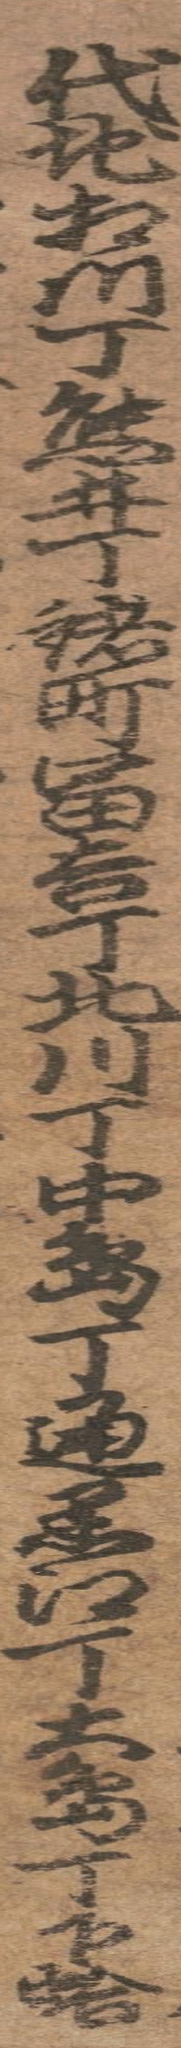代地相川丁熊井丁諸町冨吉丁北川丁中嶋町通黑江丁大嶋丁下蛤
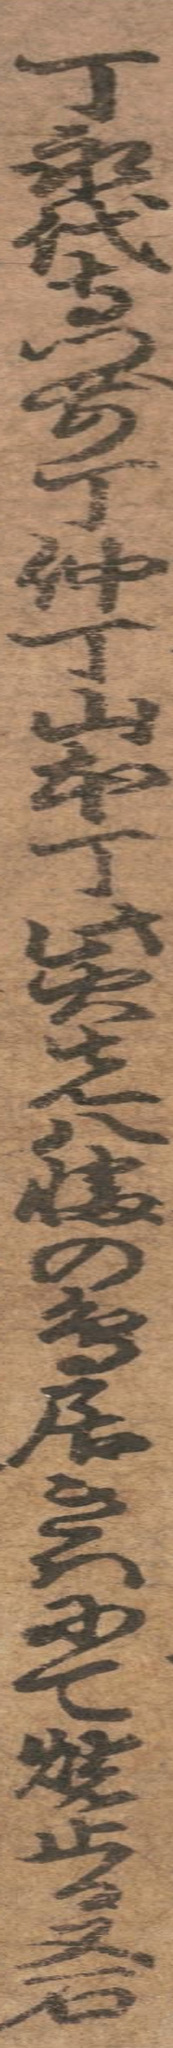丁永代寺門前丁仲丁山本丁此火者八幡の鳥居きハにて焼止る又一口
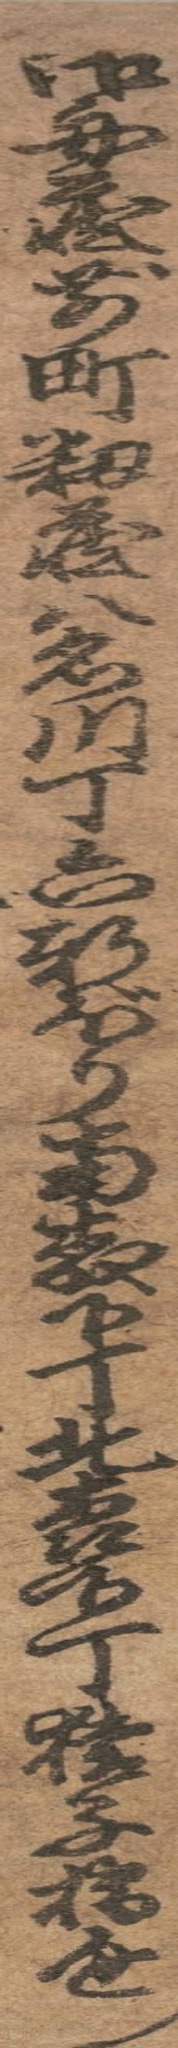御舟蔵前町籾蔵八名川丁六軒ぼり南森下丁北森下丁猿子橋通
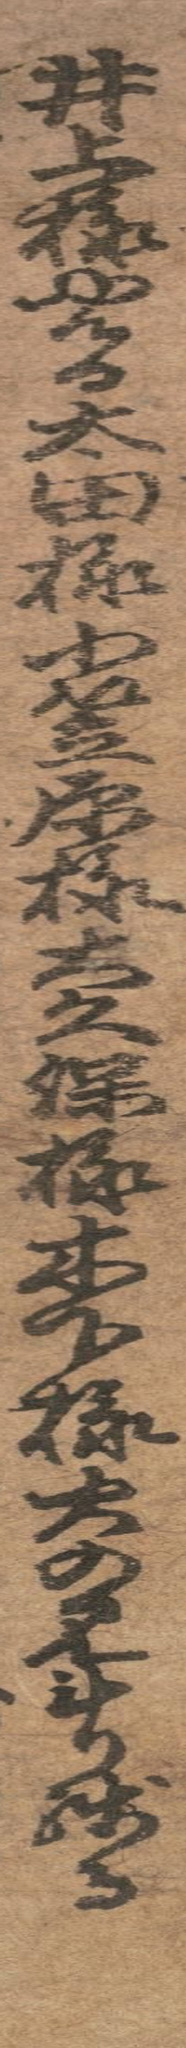井上様やける太田様小笠原様大久保様木下様火の見斗り残る
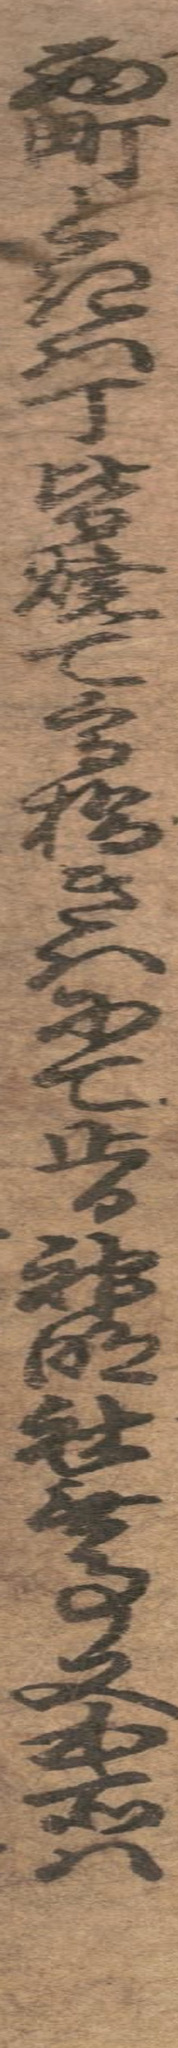西町ときハ丁皆焼て鳥橋きハにて止る神明社無事又本所ハ
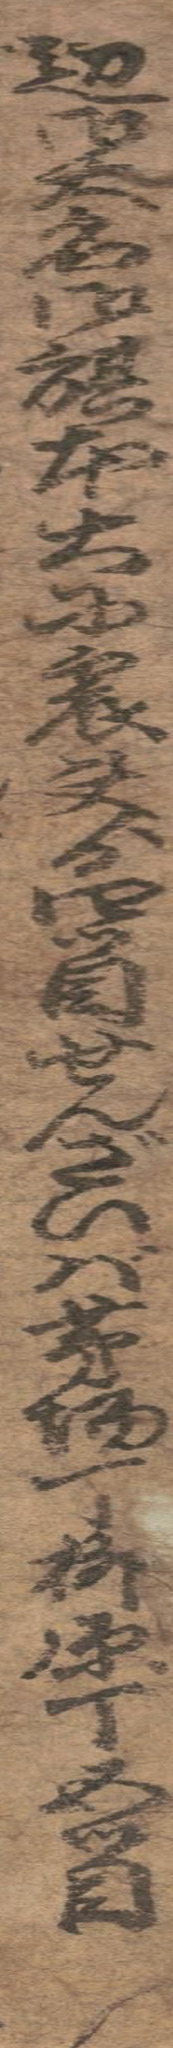辺御大名御旗本大に震夫ゟ四ッ目せんだいハ茅場丁柳原丁五ッ目
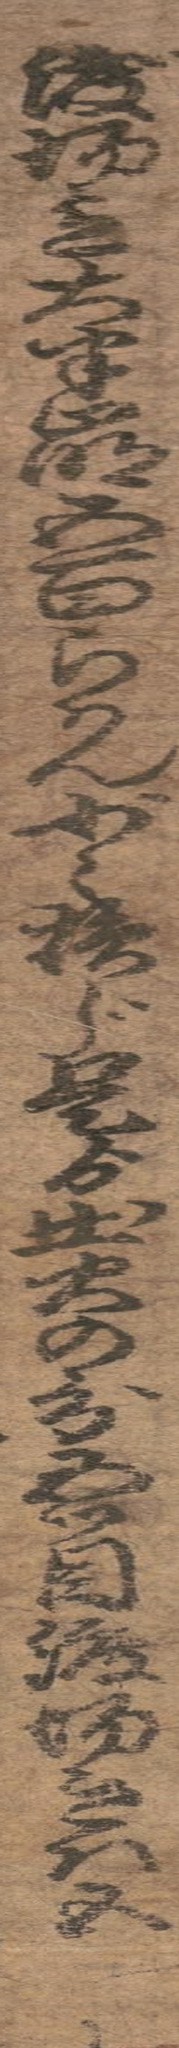渡場迄大半崩五百らかん少々損じ是より出火の分五ッ目渡場きハ五
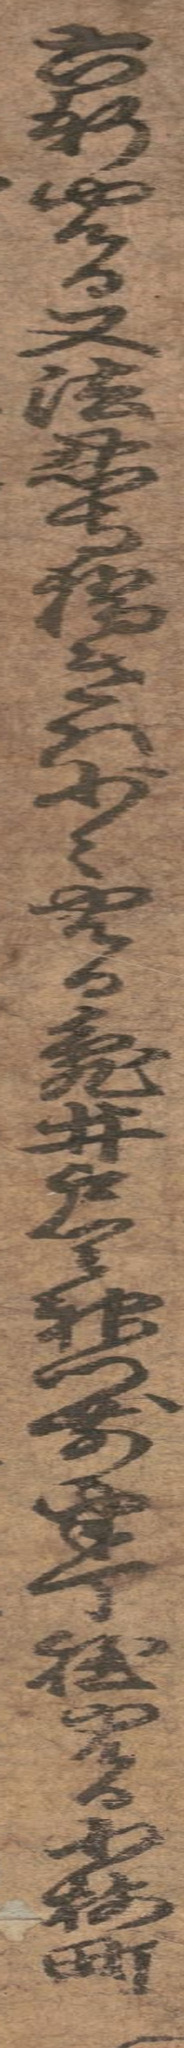六軒やける又法悲寺橋きハ少々やける亀井戸天神門前半丁程やける小梅町
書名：[安政江戸地震に関する瓦版]
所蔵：東京大学地震研究所図書室 Earthquake Research Institute Library, The University of Tokyo, JAPAN
